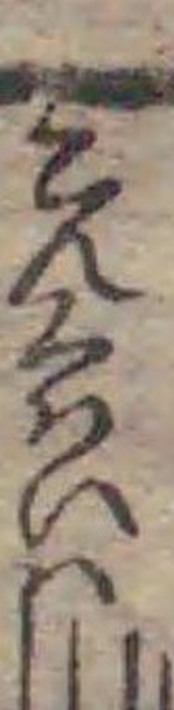こんくはいは
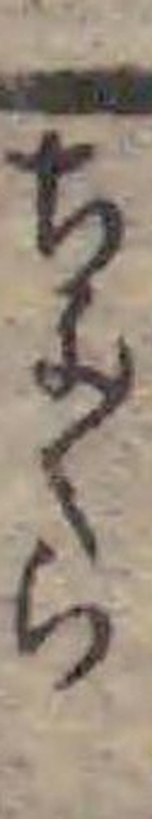ちよ〳〵ら
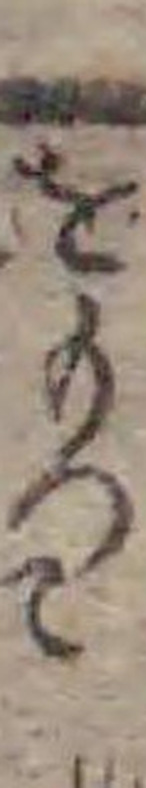をもつて
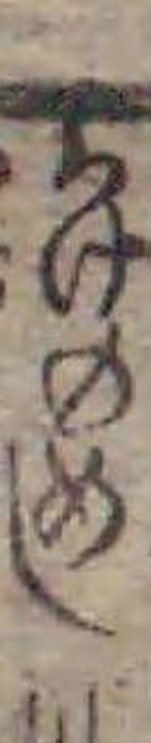かけのめし
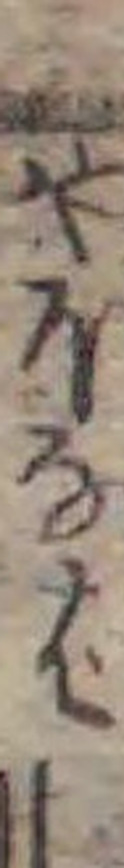やぼなは
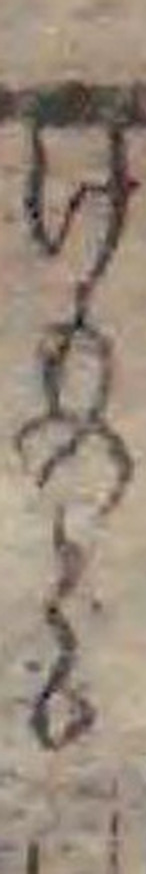けものとも
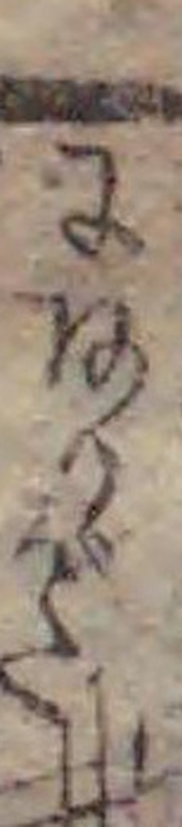にありがた
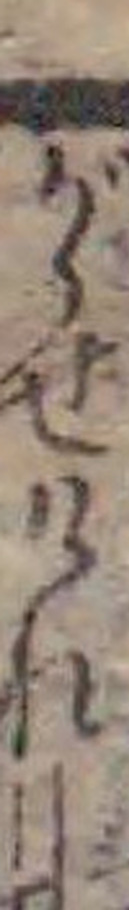がらせけれ
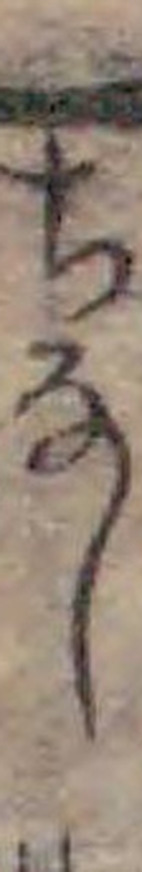ちなし
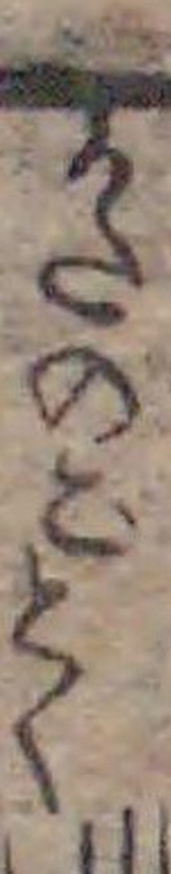かたのごとく
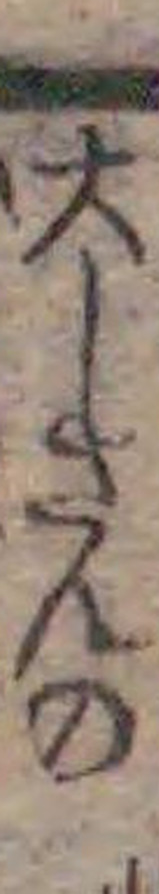大しさんの
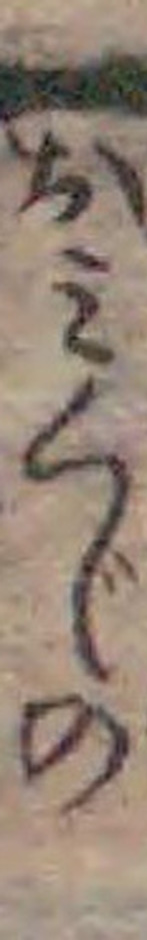おみくじの
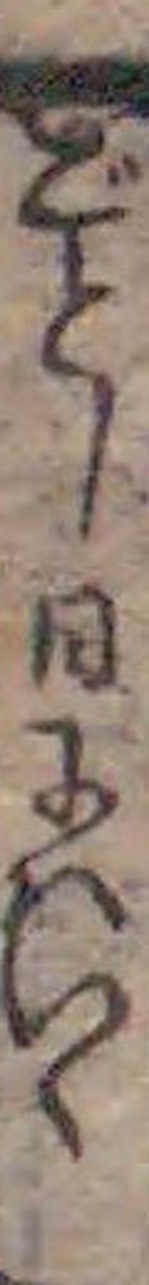ごとし日にはいゝ
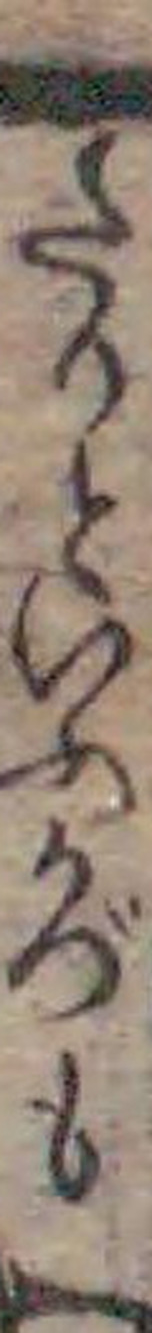たりといふかづも
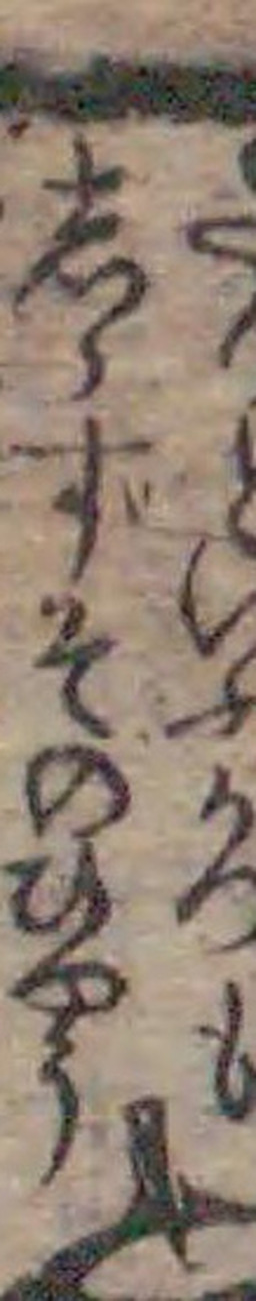しらずそのひやう
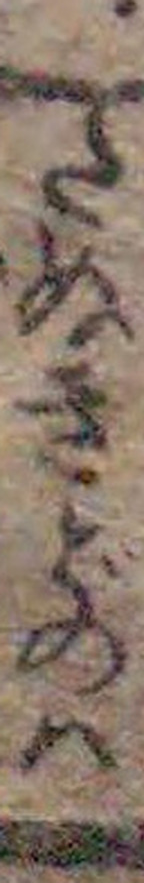たぬきどのは
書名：化物楽屋異牒 : 2巻
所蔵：国立国会図書館 National Diet Library, JAPAN
